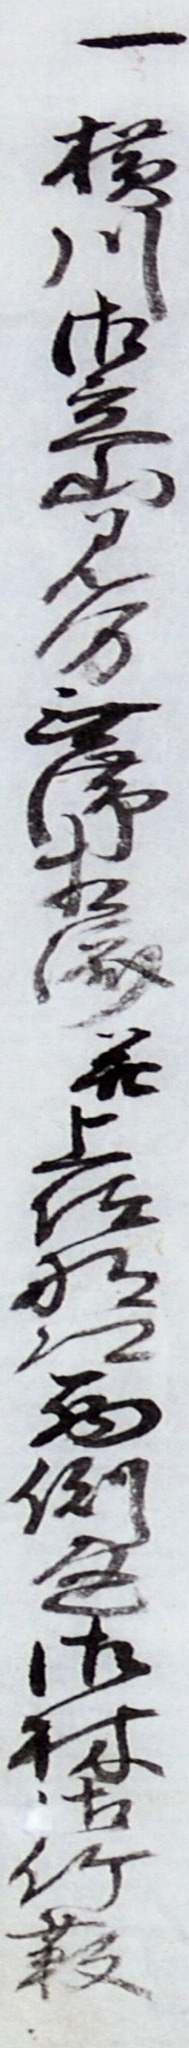一横川御立山見分無滞相済并上伊那郷西側通御林御竹藪
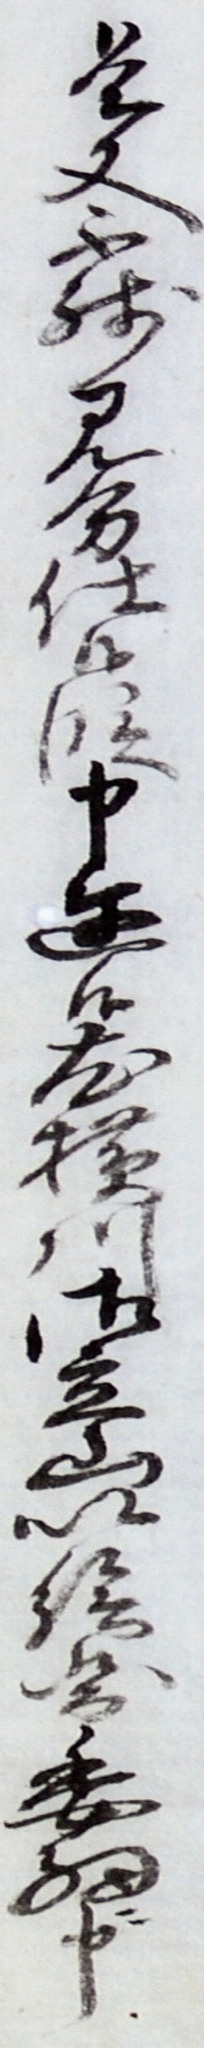是又不残見分仕候段申達候尤横川御立山以絵図委細ニ申

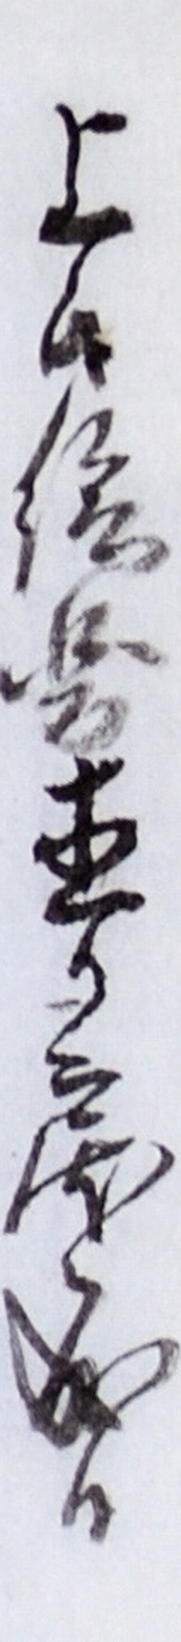上候絵図直り戻成候
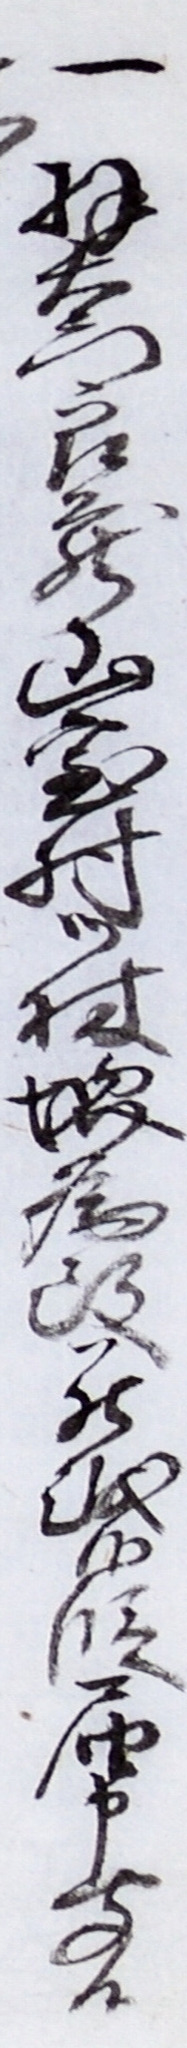一羽右衛門良蔵山室村御林境為改罷越候段届申聞候
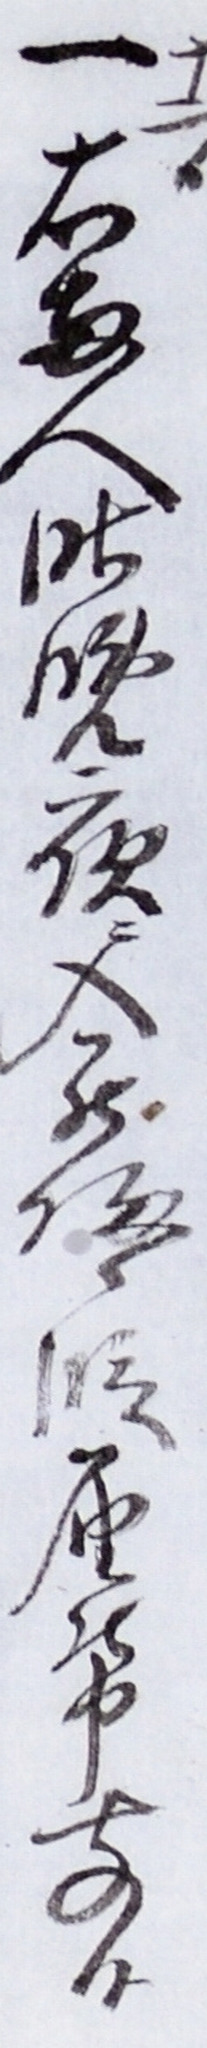一右両人昨晩夜ニ入罷帰候段届被申聞候
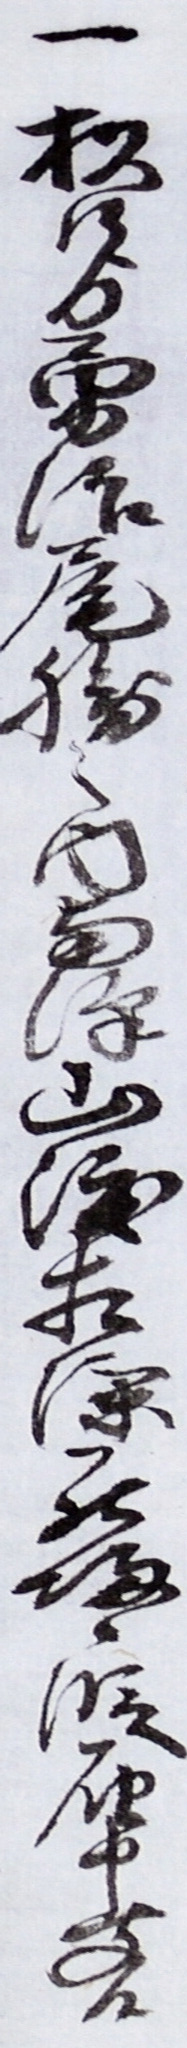一杉左衛門勇治尾勝之内南沢山渡相添罷帰候段届申述候
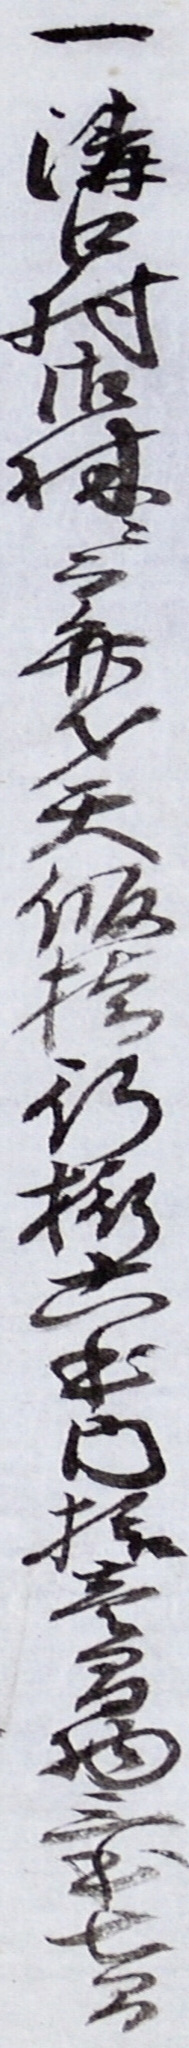一溝口村御林ニ而弁才天仮橋行桁六本内様壱間物三本七間
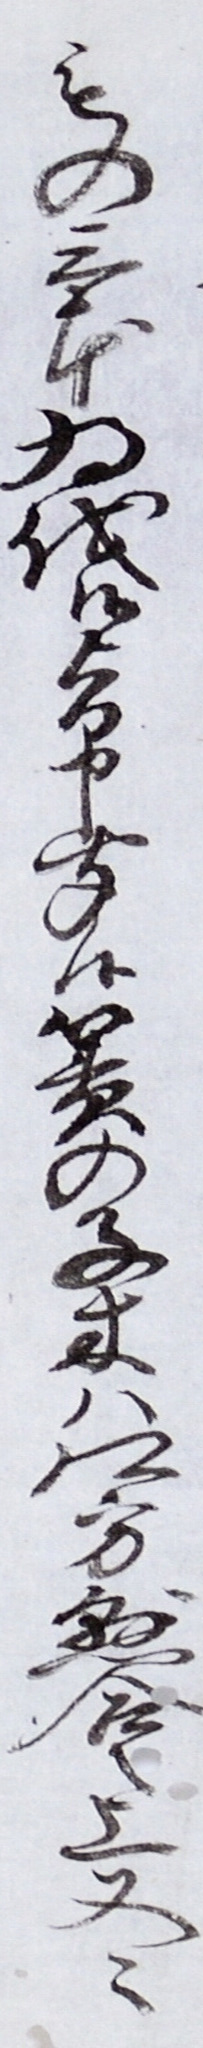もの三本為伐候旨申聞候簀の子木ハ郷方懸合之上又々
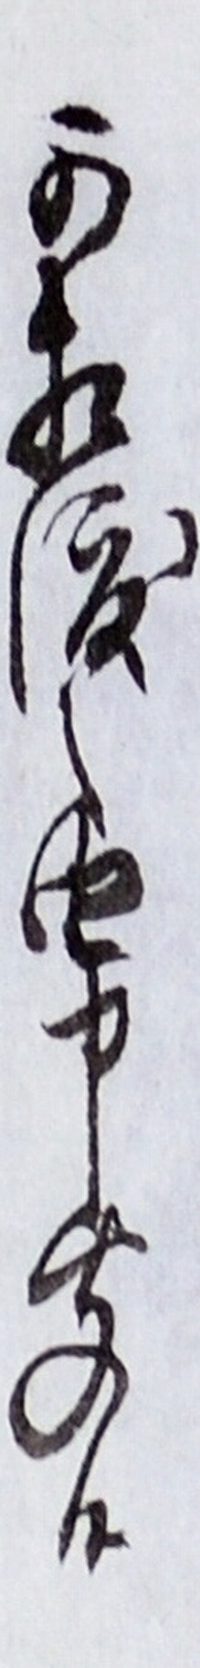可相渡之由申聞候
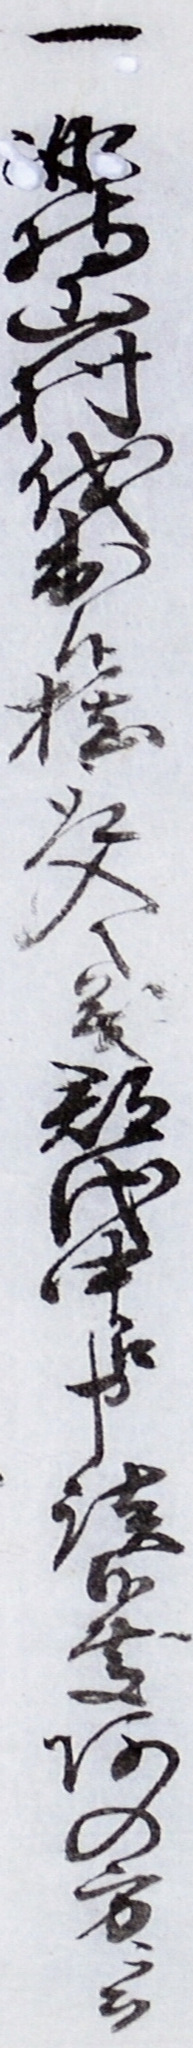一非持山村伐出候椹取入之義郡代中江申談候処何の方ニ而
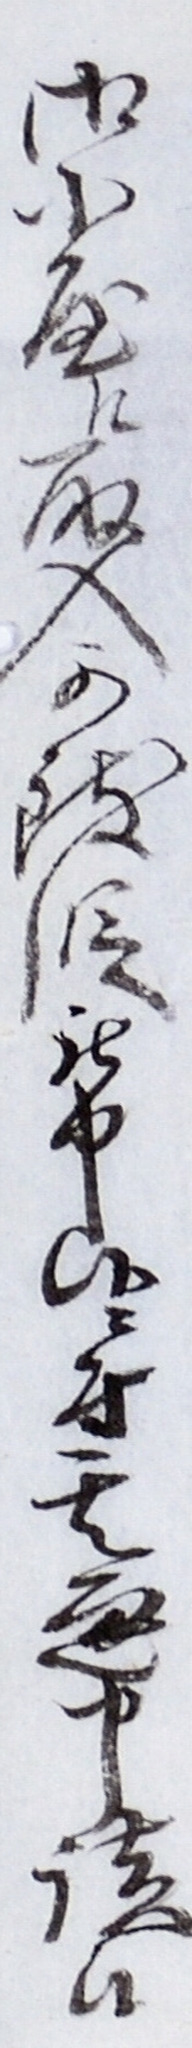御小屋江取入可致段被申候ニ付其通申談候
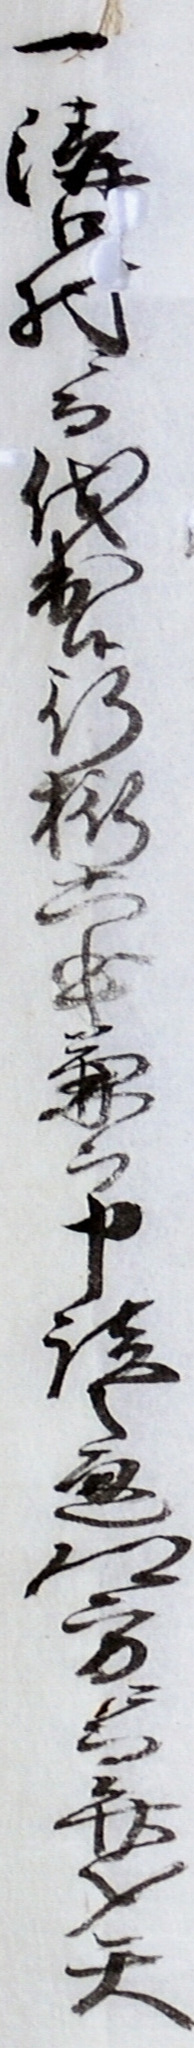一溝口村ニ而伐出候行桁六本兼而申談之通郷方ニ而弁才天
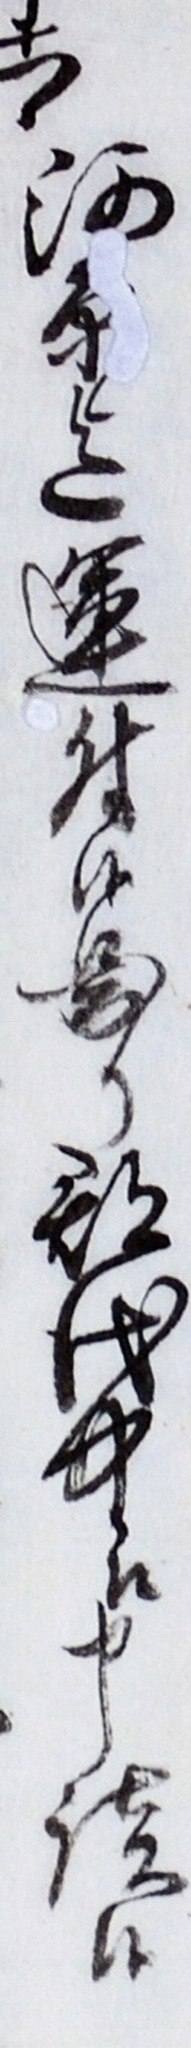河原迄運付候図り郡代中江申談候
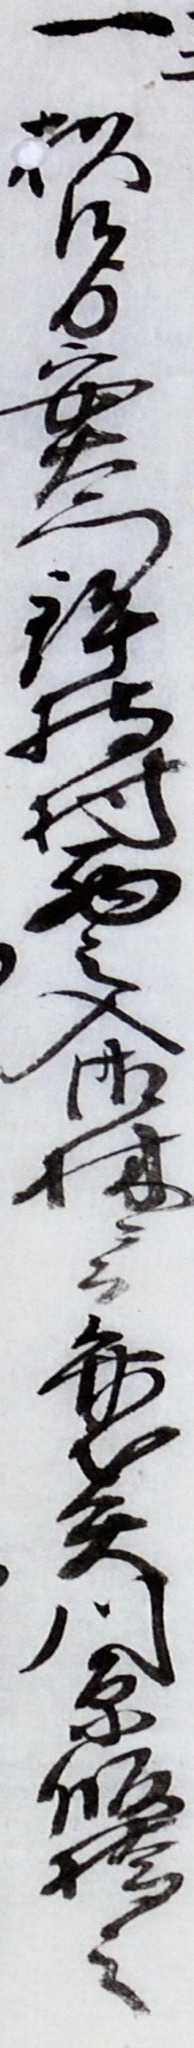一杉左衛門安右衛門鉾持村西之入御林ニ弁才矢川原飯橋之
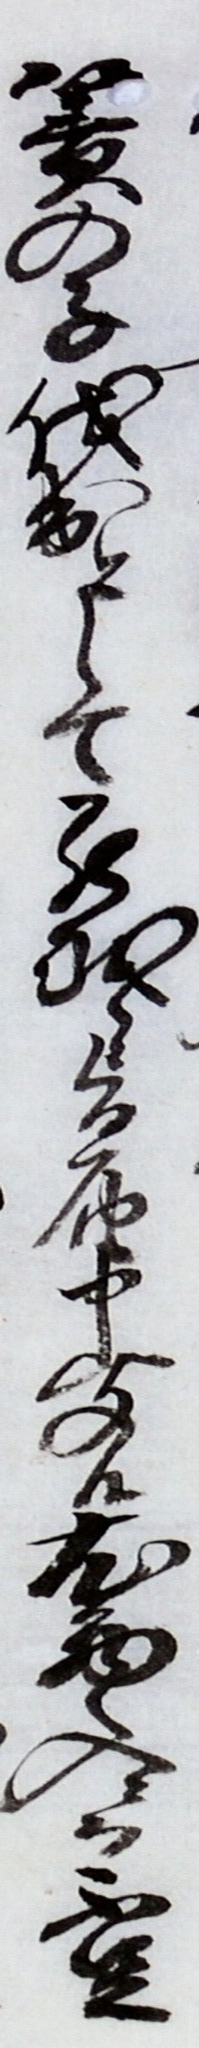簀の子伐出として罷越候旨届申聞候尤西入ニ而不足
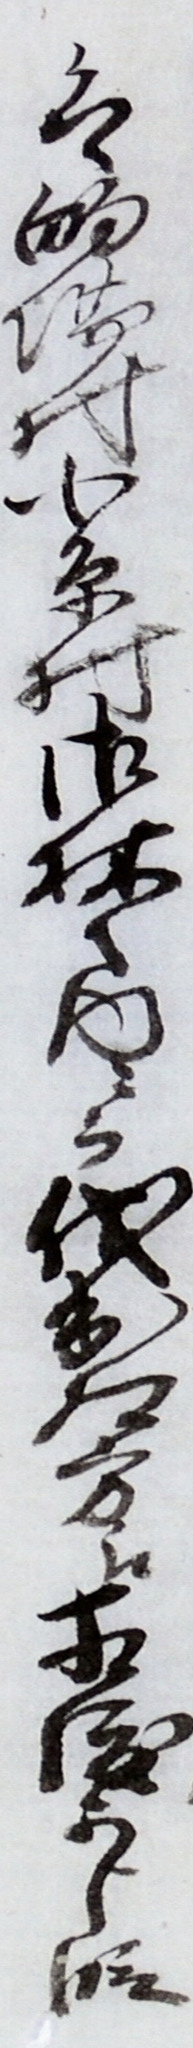鳥的場村小原村御林之内ニ而伐出郷方江相渡可申段
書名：御山奉行御用控
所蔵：伊那市立高遠町図書館・合同会社AMANE
